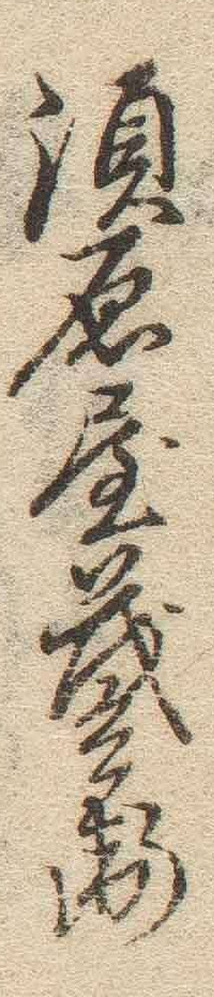須原屋茂平衛
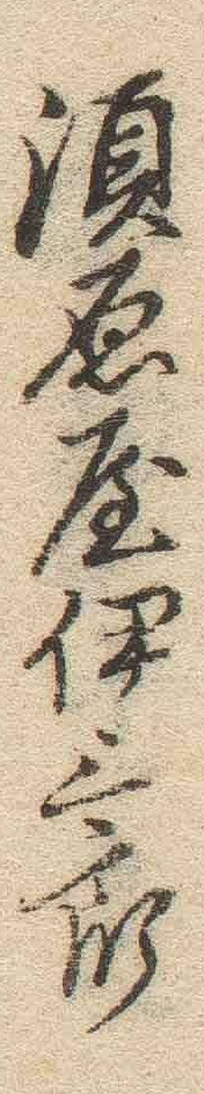須原屋伊三郎
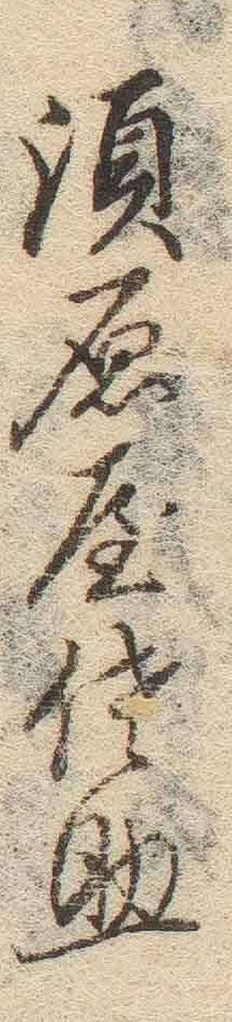須原屋佐助
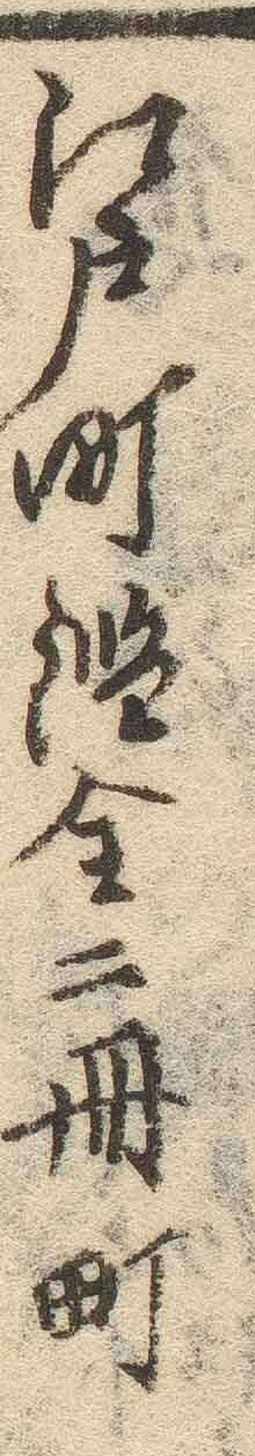江戸町鑑全二冊町
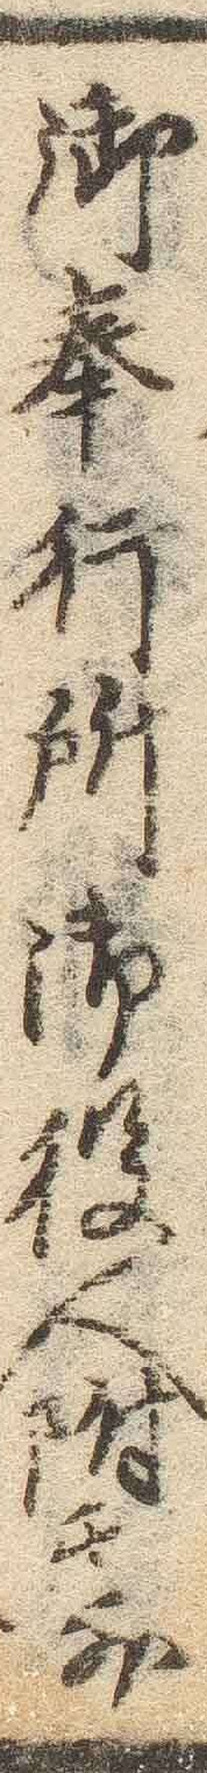御奉行所御役人附其外
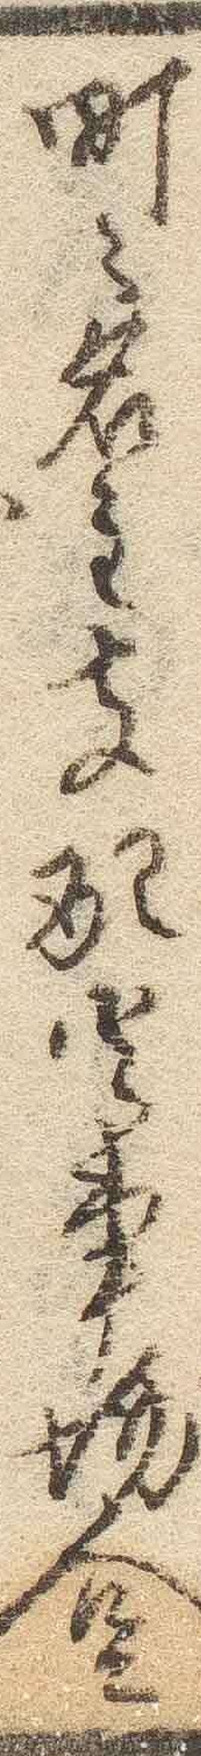町之名主支配火事場人足
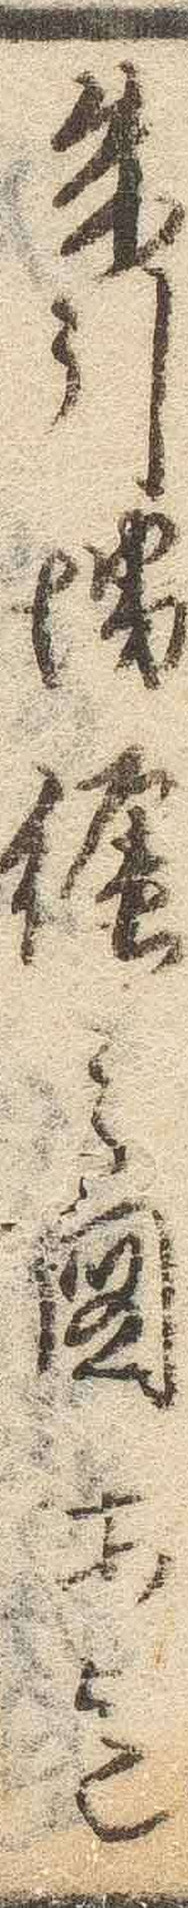朱引堀径之図等迄
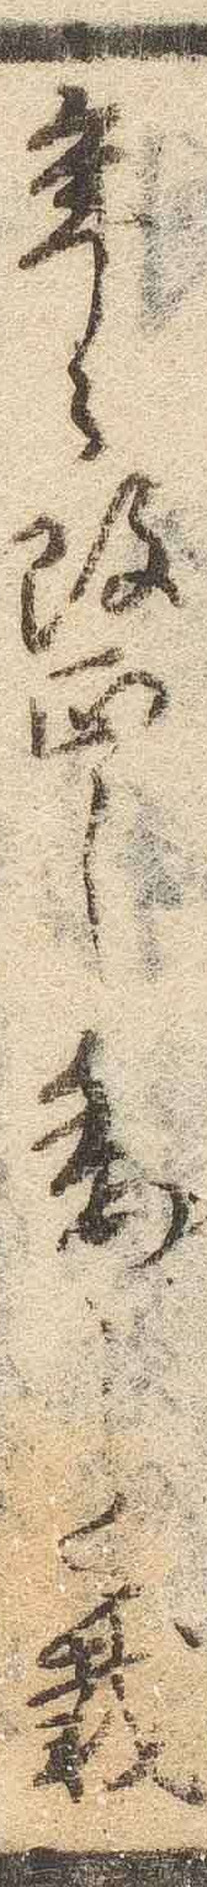年々改正し委しく載
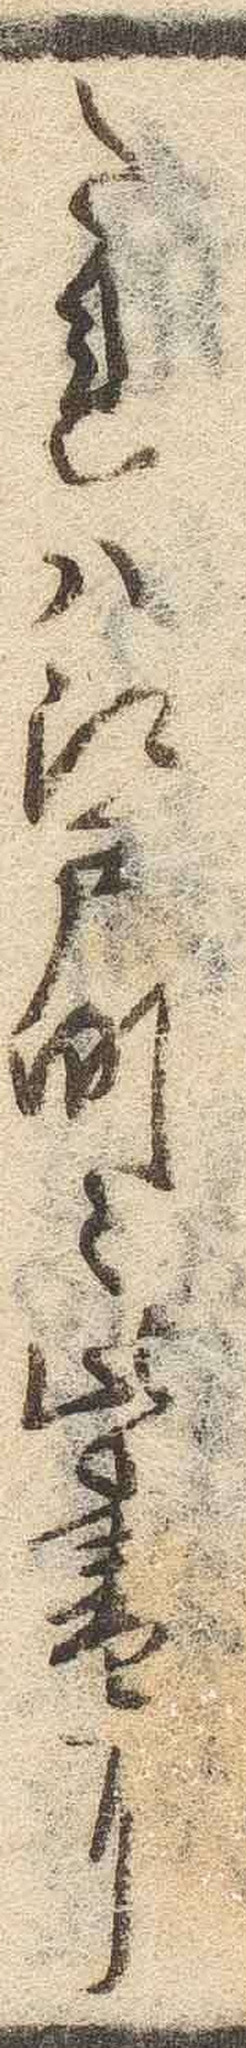たれは江戸町々此書に
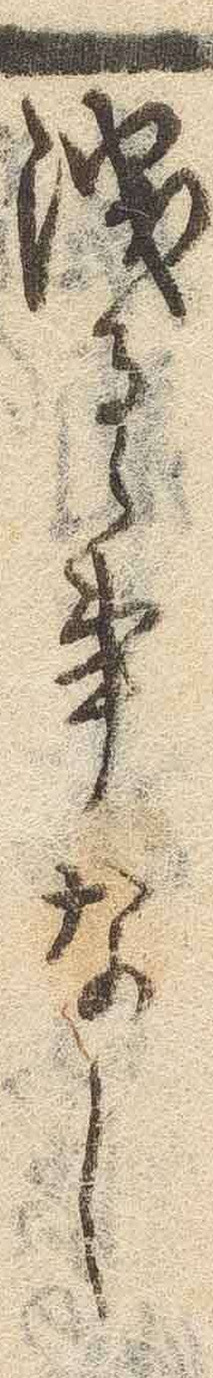洩るゝ事なし
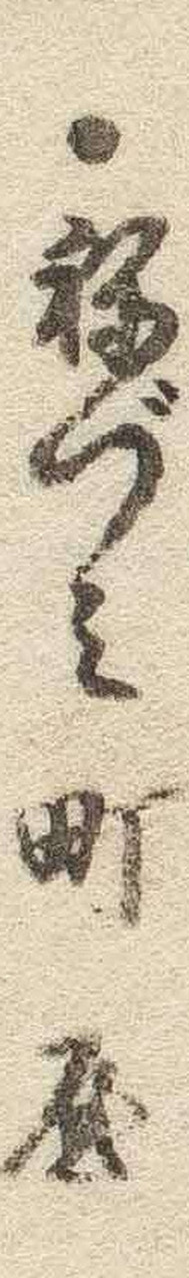・ねづみ町屋
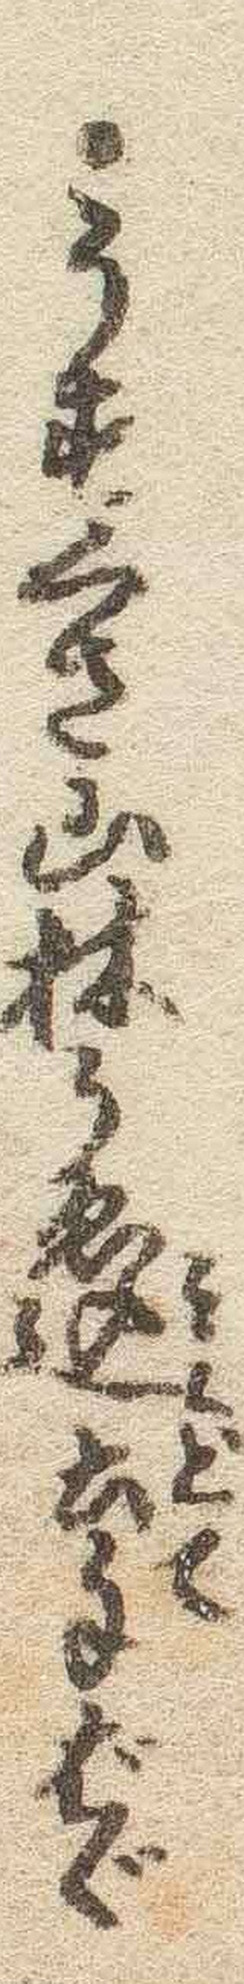・うすくさ山林うゑ込土手ばゞ
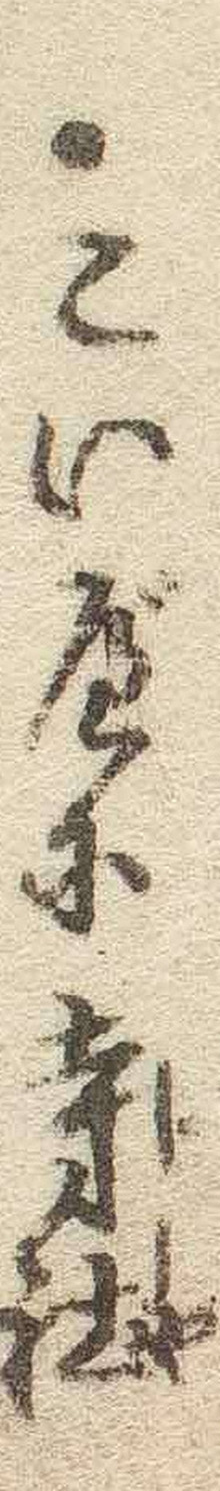・こいべに寺社
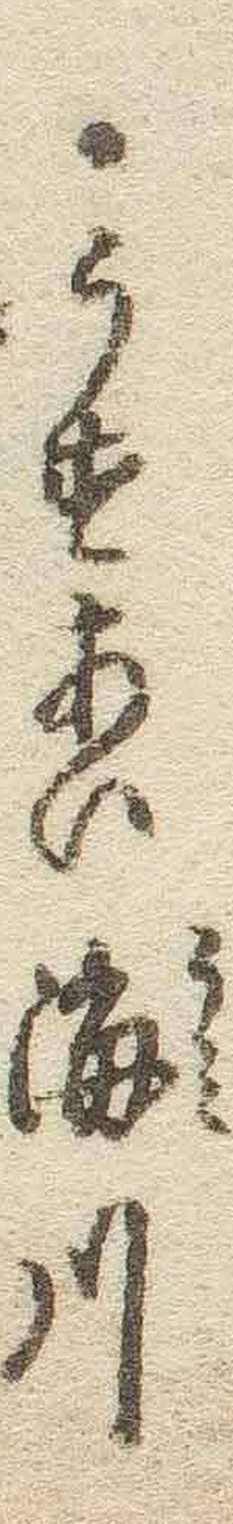・うすあい海川
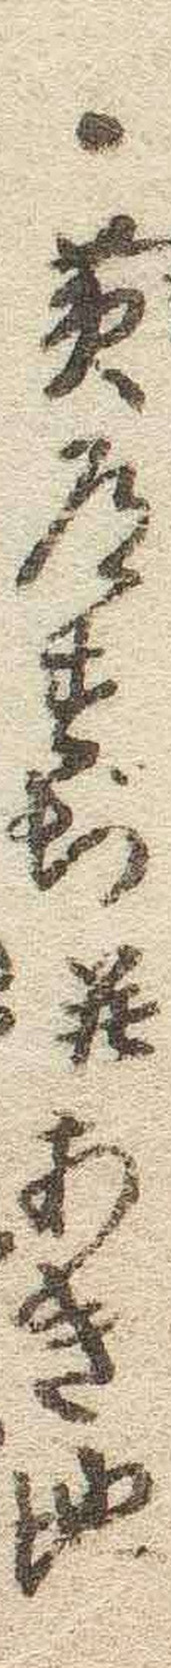・黄道すぢ并あき地
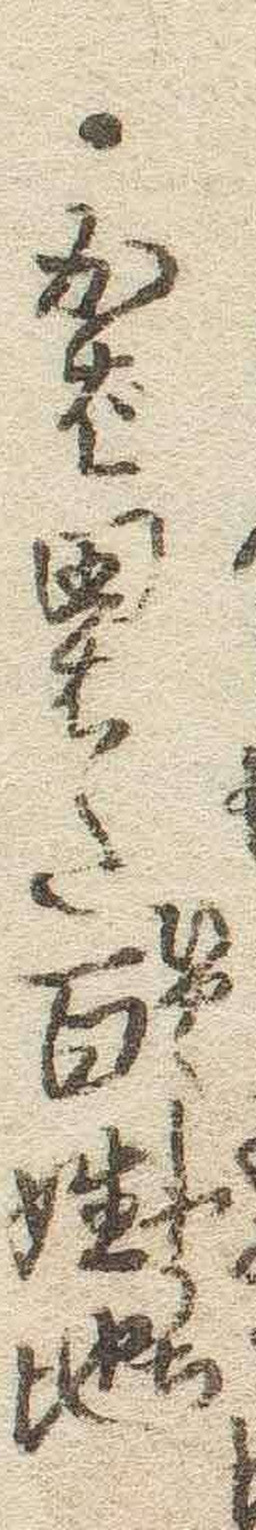・かば田はた百姓地
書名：江戸町独案内
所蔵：東京学芸大学附属図書館 国文学研究資料館
